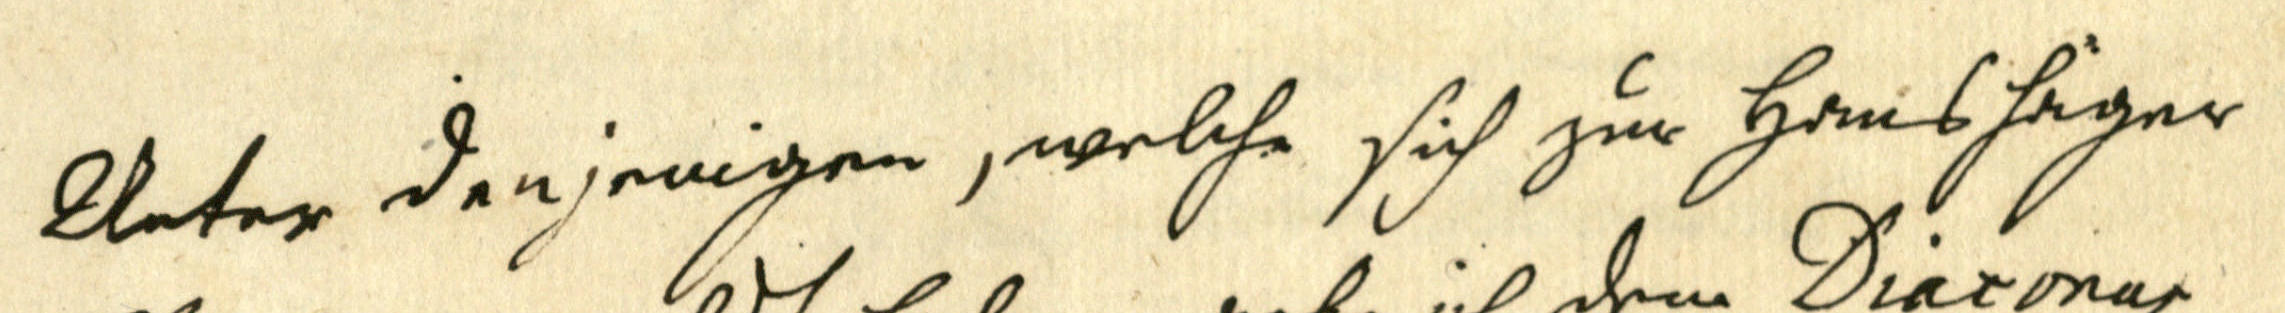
Unter denjenigen, welche sich zur Hanshäger
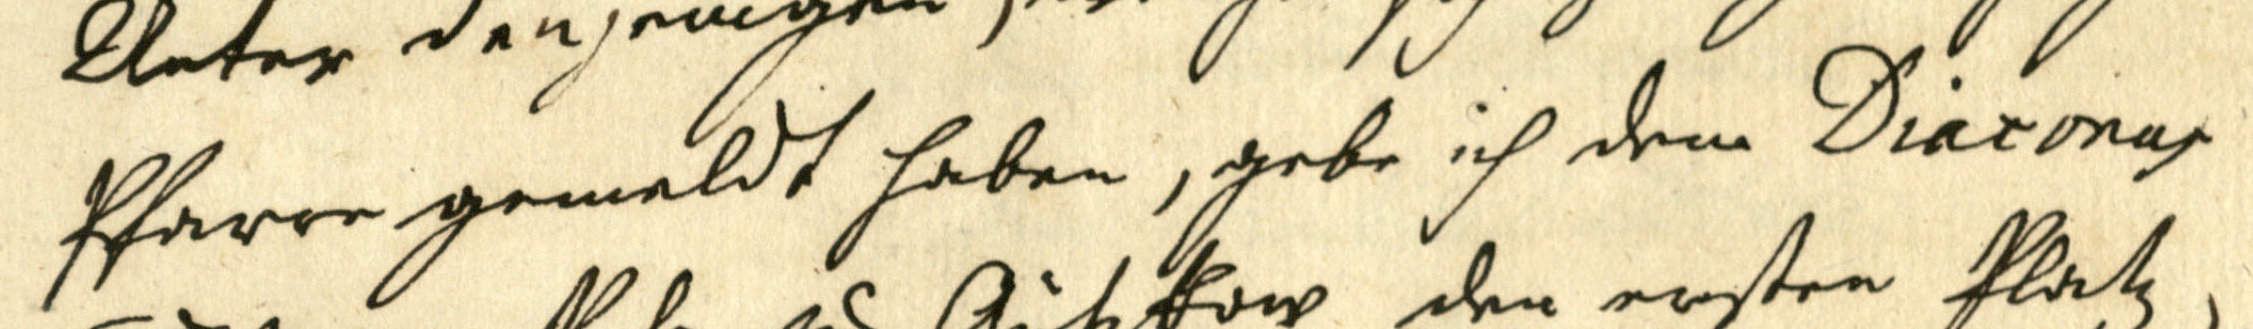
Pfarre gemeldt haben, gebe ich dem Diaconus
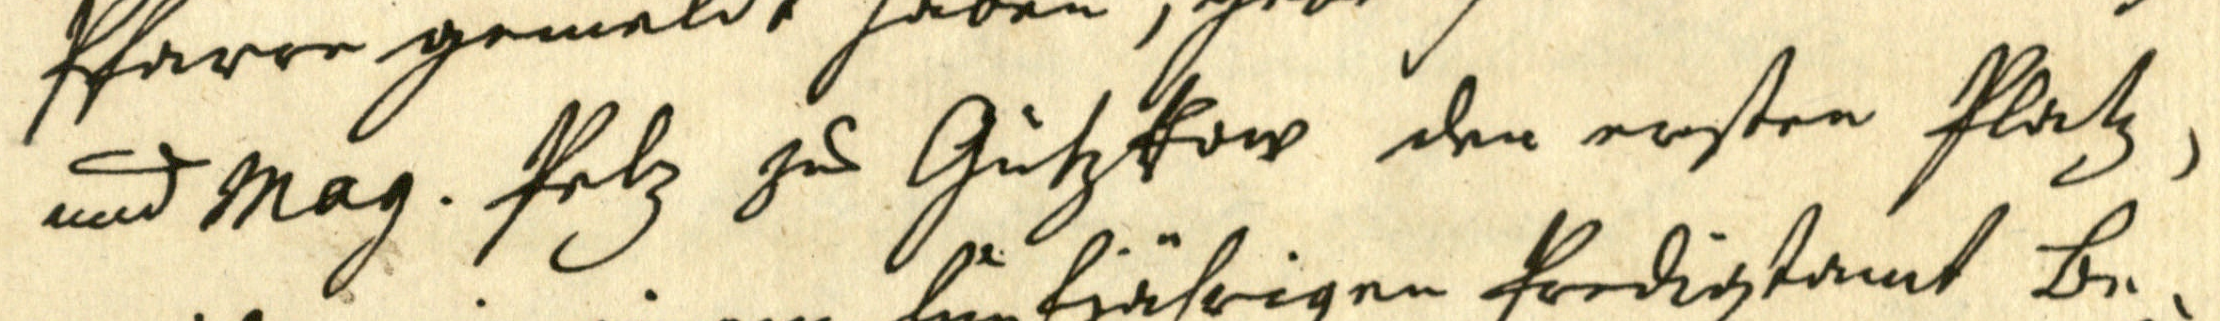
und Mag. Pelz zu Gützkow den ersten Platz,
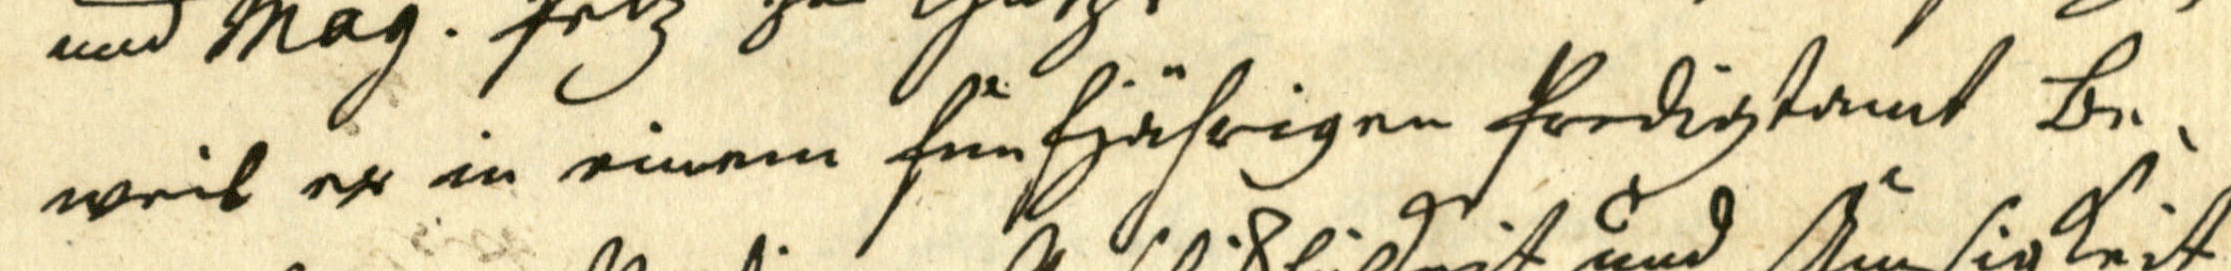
weil er in einem fünfjährigen Predigtamt Be¬
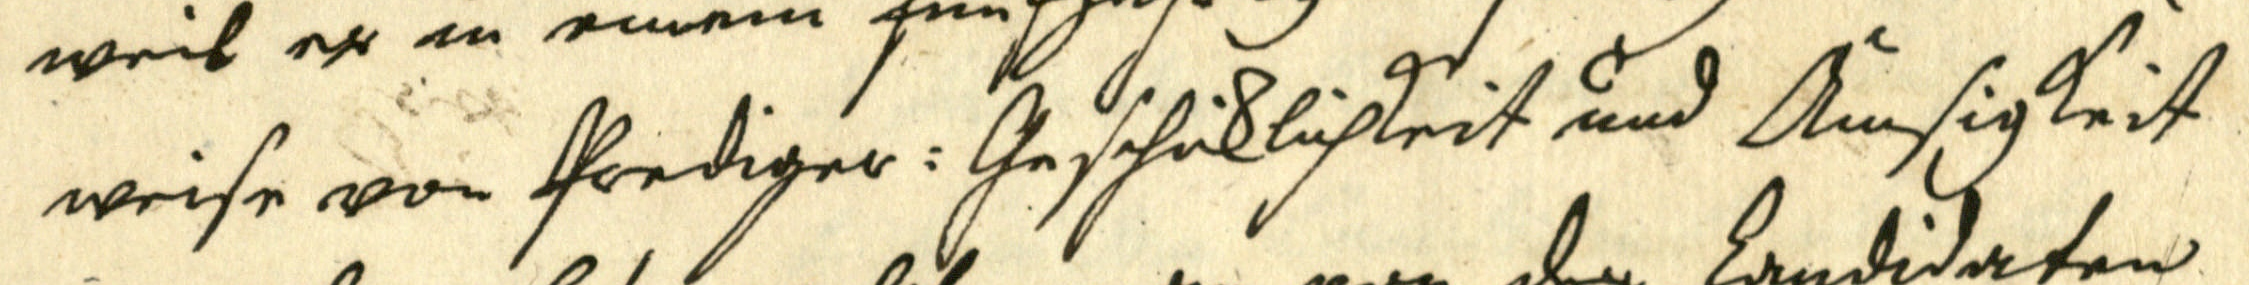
weise von Prediger-Geschicklichkeit und Ämsigkeit
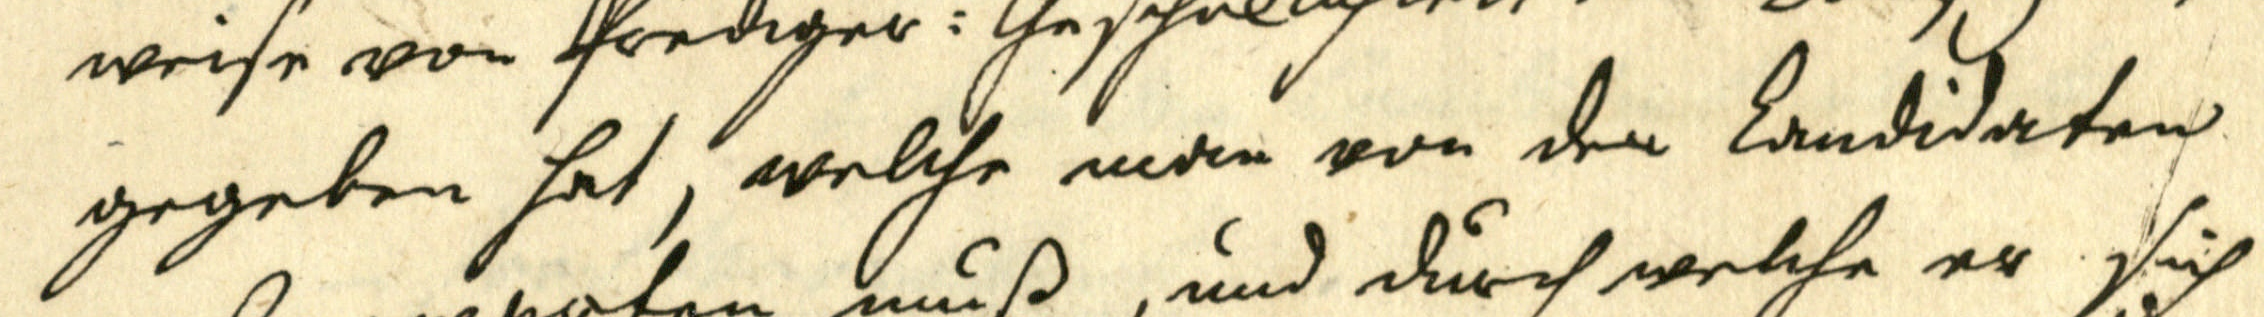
gegeben hat, welche man von den Candidaten
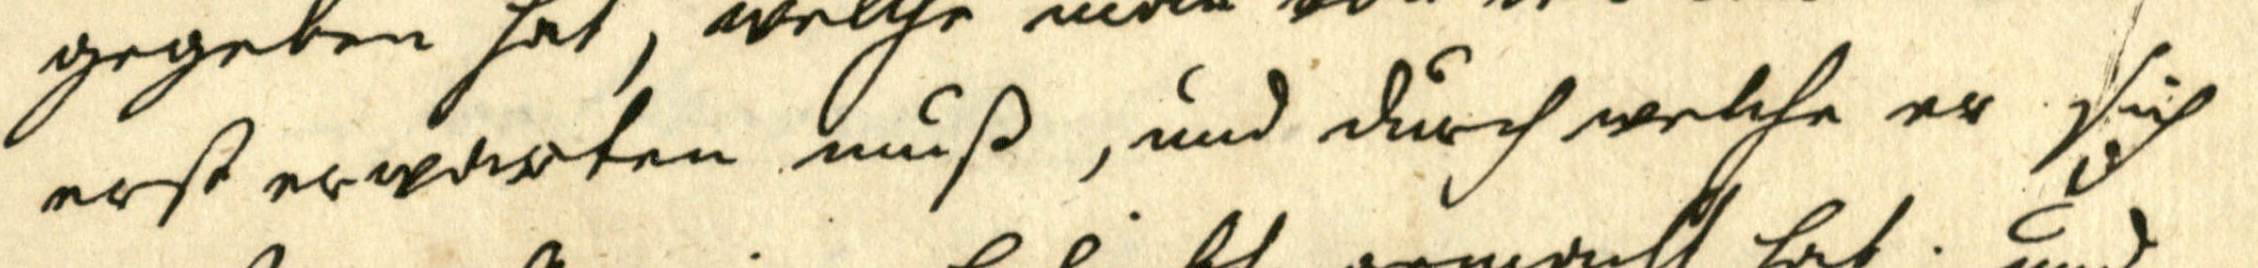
erst erwarten muß, und durch welche er sich
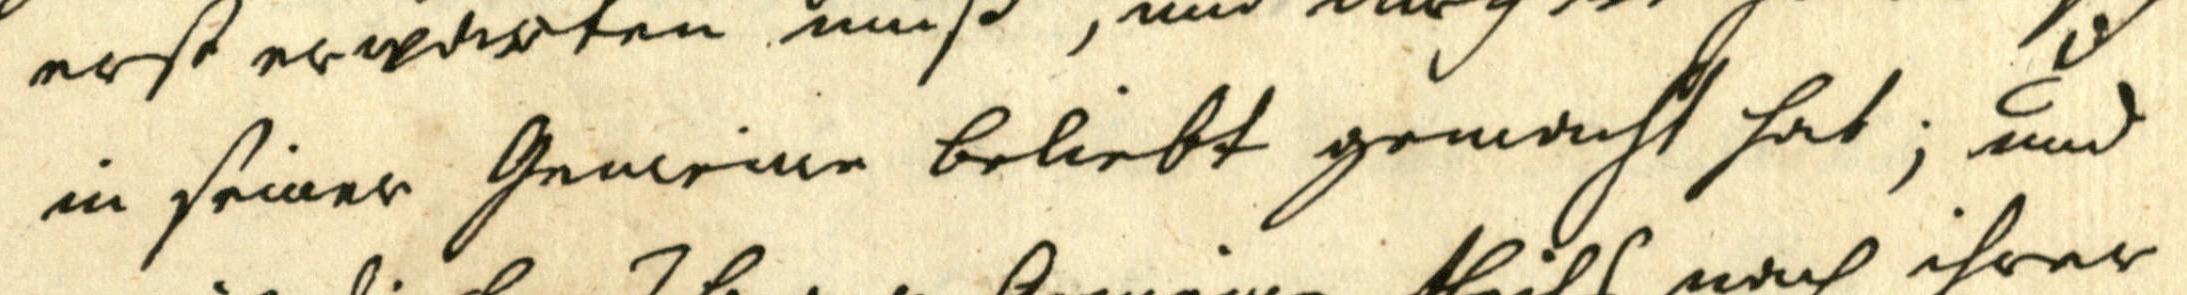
in seiner Gemeine beliebt gemacht hat, und
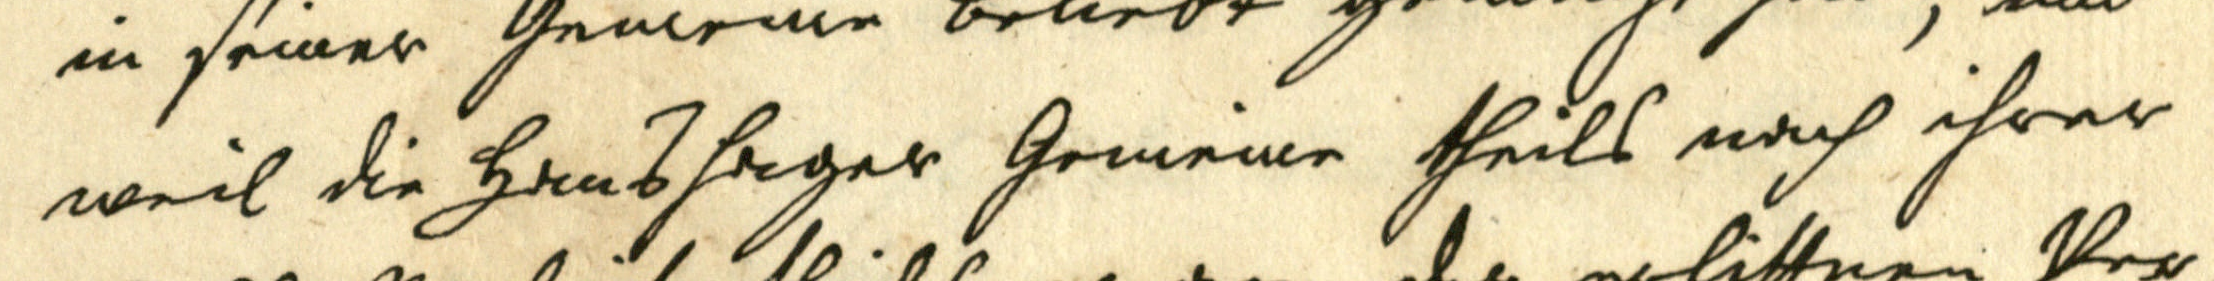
weil die Hanshager Gemeine theils nach ihrer
